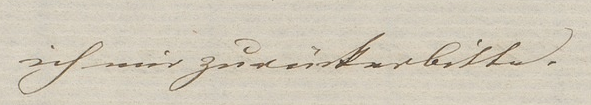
ich mir zurückerbitte.
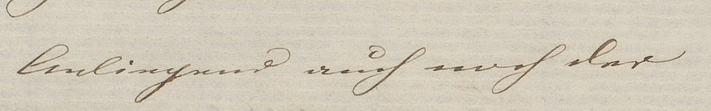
Anliegend auch noch der
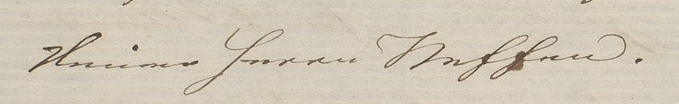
Deinen Herrn Neffen.
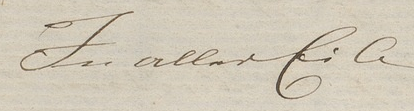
In aller Eile
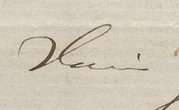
Dein
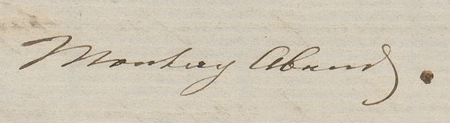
Montag Abend.
